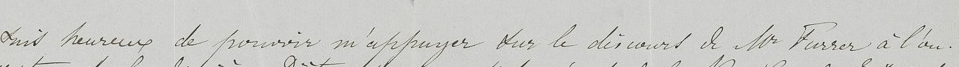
suis heureux de pouvoir m'appuyer sur le discours de MrFurrer à l'ou-
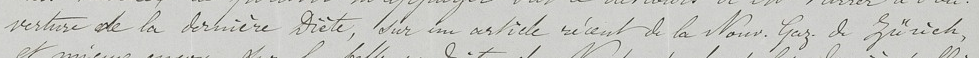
verture de la dernière Diète, sur un article récent de la Nouv. Gaz. de Zürich ,
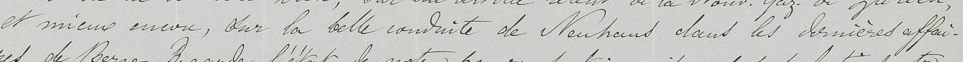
et mieux encore, sur la belle conduite de Neuhaus dans les dernières affai-
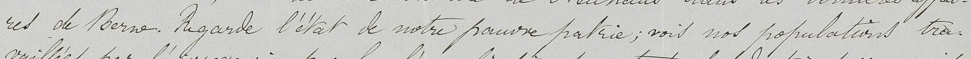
res de Berne. Regarde l'état de notre pauvre patrie; vois nos populations tra-
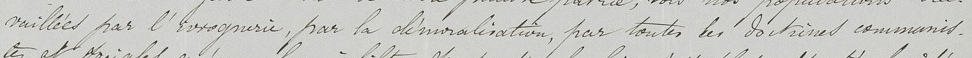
vaillées par l'ivrognerie, par la démoralisation, par toutes les doctrines communis-
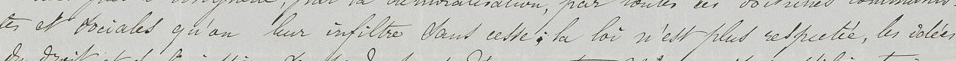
tes et sociales qu'on leur infiltre sans cesse; la loi n'est plus respectée, les idées
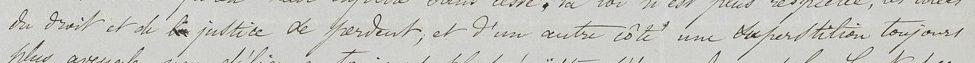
du droit et de la justice se perdent; et d'un autre côté une superstition toujours
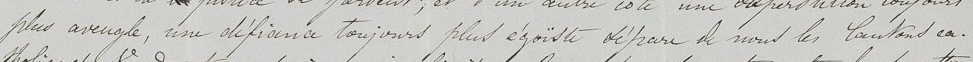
plus aveugle, une défiance toujours plus égoïste sépare de nous les Cantons ca-
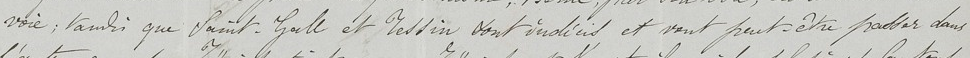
voie; tandis que Saint-Gall et Tessin sont indécis et vont peut-être passer dans
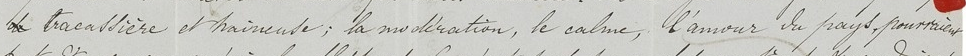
de tracassière et haineuse; la modération, le calme, l'amour du pays pourraient
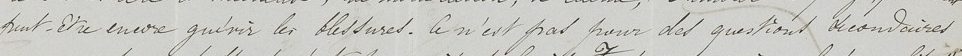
peut-être encore guérir les blessures. Ce n'est pas pour des questions secondaires
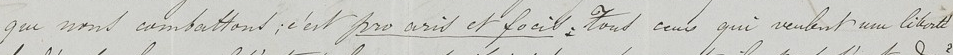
que nous combattons; c'est pro aris et focis. Tous ceux qui veulent une liberté
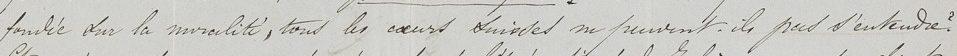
fondée sur la moralité, tous les cœurs suisses ne peuvent-ils pas s'entendre?
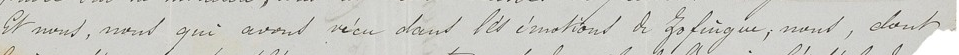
Et nous, nous qui avons vécu dans les émotions de Zofingen; nous, dont
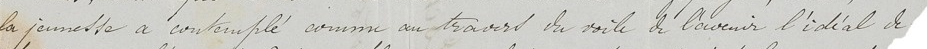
la jeunesse a contemplé comme au travers du voile de l'avenir l'idéal de la
